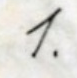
1.
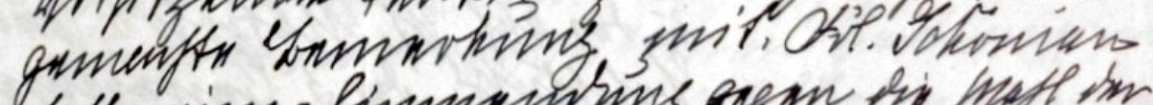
gemachten Bemerkung mit Frl. Schönian.
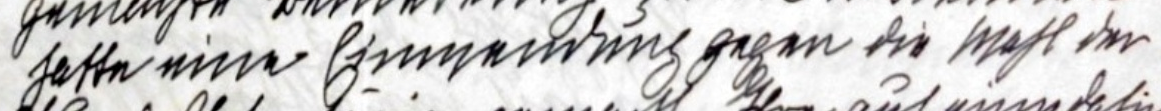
hatte eine Einwendung gegn die Wahl der
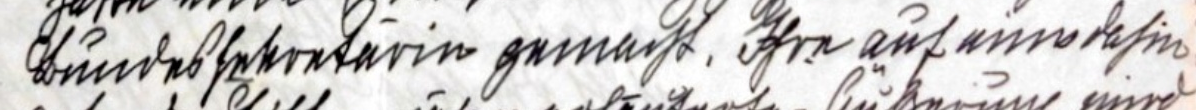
Bundessekretärin gemacht. Ihre auf ein dahin
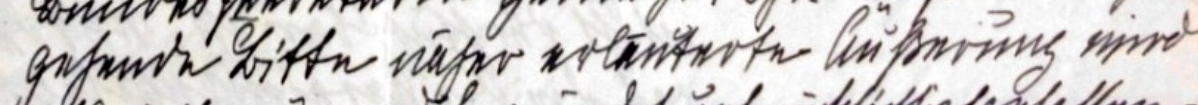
gehende Bitte näher erläuterte Äußerung wird
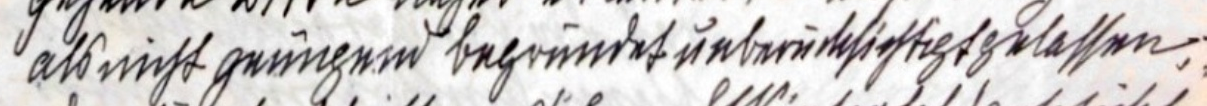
als nicht genügend begründet unberücksichtigt gelassen.
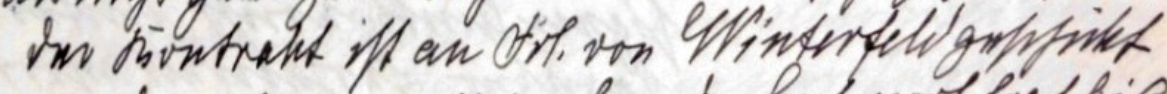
Der Kontrakt ist an Frl von Winterfekd geschickt
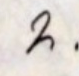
2
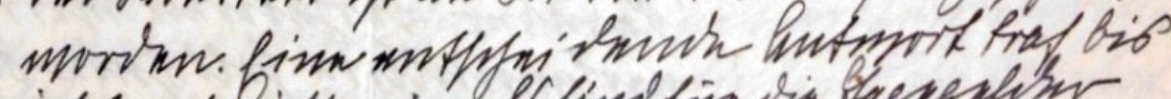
worden. Eine enstsprechende Antwrot traf bis
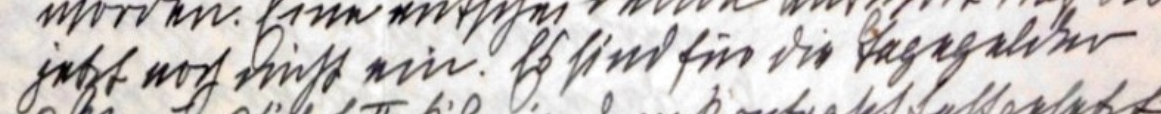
jetzt noch nicht ein. Es sind für die Tagesgebühr
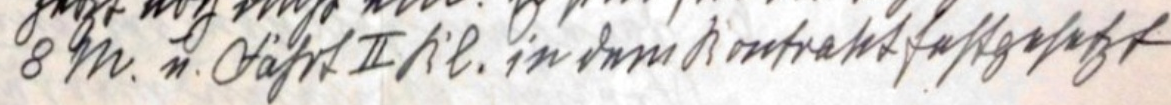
8 M. u. Fahrt II. Kl. in dem Kontrakt festgesetzt.
